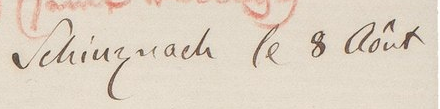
Schinznach le 8 Août
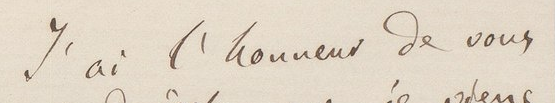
J'ai l'honneur de vous
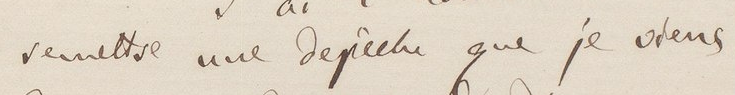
remettre une depêche que je viens
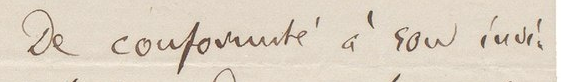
De conformité à son invi-
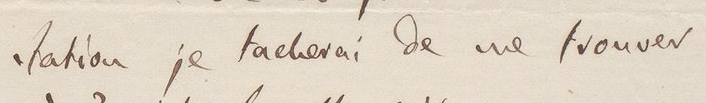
tation je tacherai de me trouver
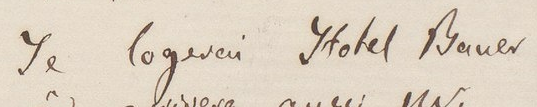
Je logerai Hotel Bauer
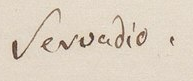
Servadio.
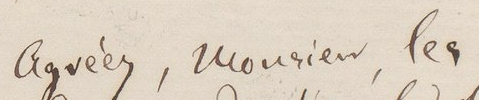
Agréez, Monsieur, les
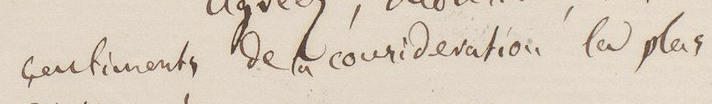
sentiments de la considération la plus
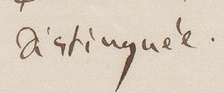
distinguée.
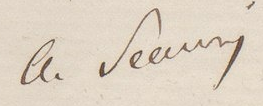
G. Scanzi
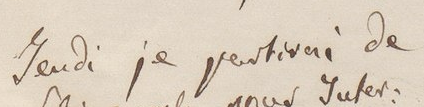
Jeudi je partirai de
